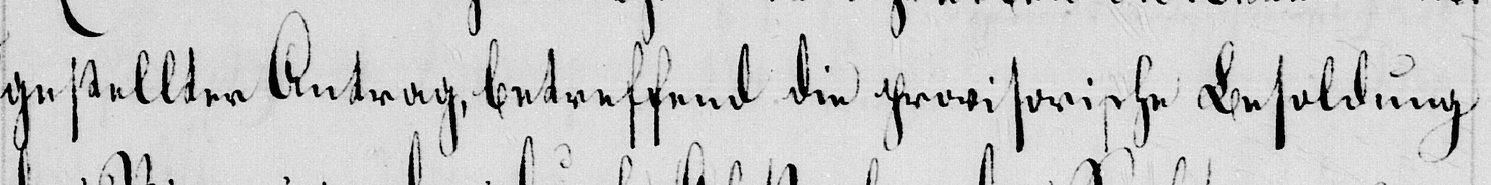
gestellter Antrag, betreffend die provisorische Besoldung
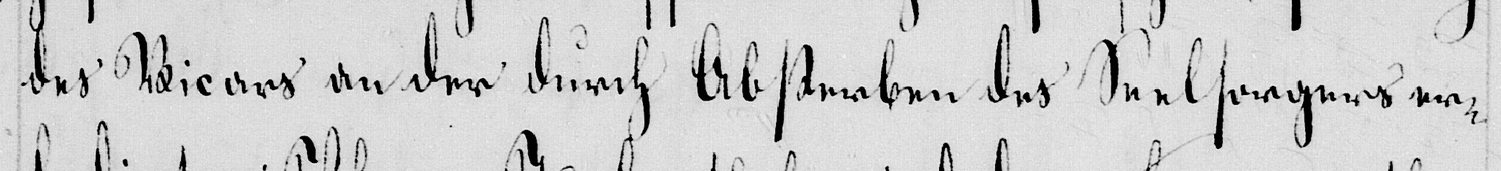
des Vicars an der durch Absterben des Seelsorgers er¬
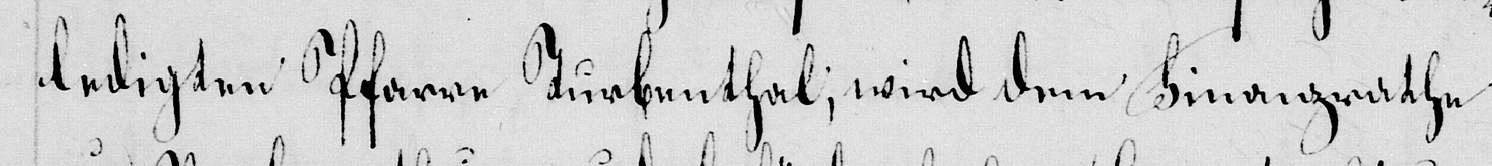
ledigten Pfarre Turbenthal, wird dem Finanzrathe
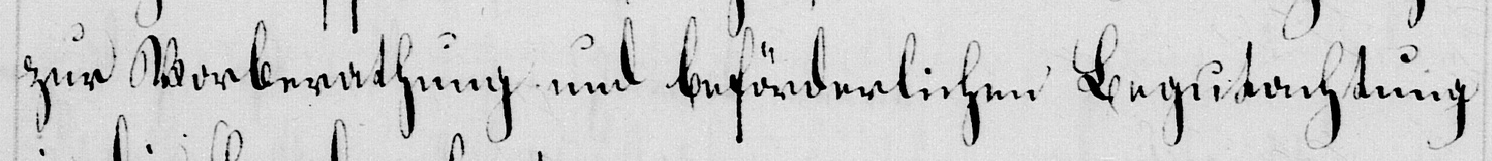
zur Vorberathung und beförderlichen Begutachtung
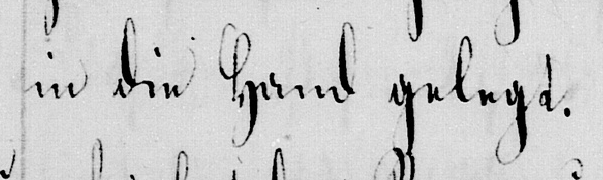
in die Hand gelegt.
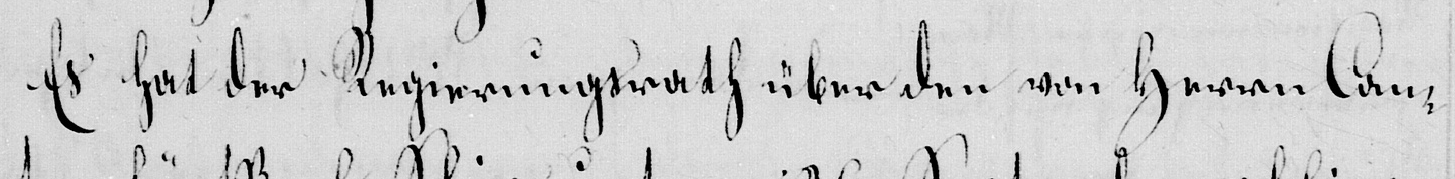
Es hat der Regierungsrath über den von Herrn Can¬
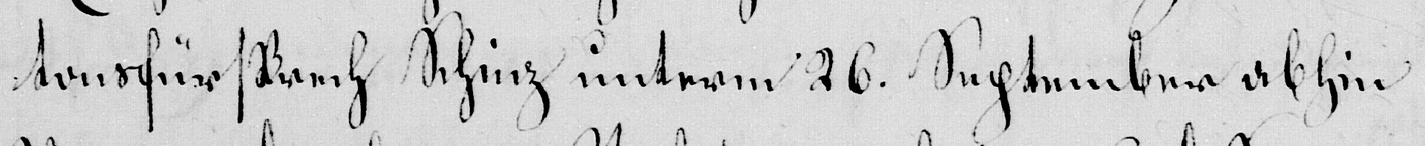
tonsfürsprech Schinz unterm 26. September abhin
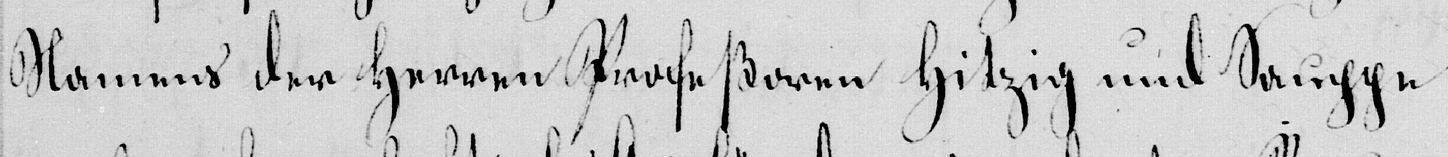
Namens der Herren Profeßoren Hitzig und Sauppe
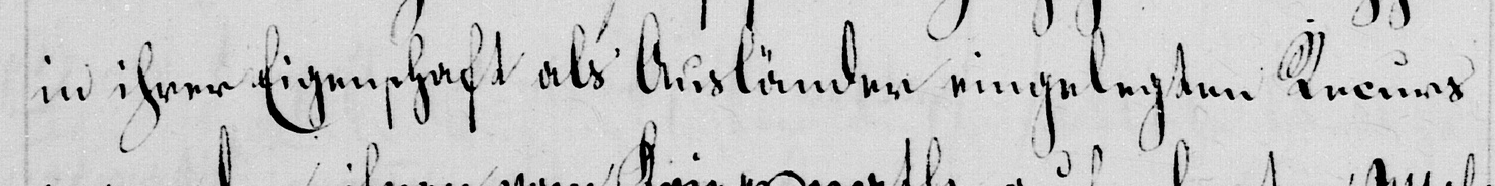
in ihrer Eigenschaft als Ausländer eingelegten Recurs
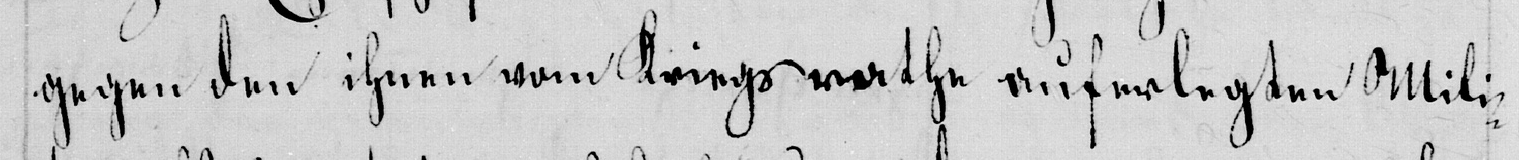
gegen den ihnen vom Kriegsrathe auferlegten Mili¬
